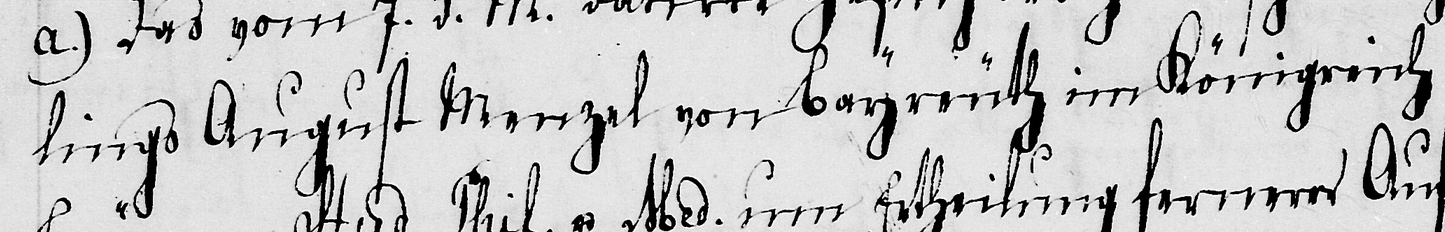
lings August Menzel von Bayreuth im Königreich
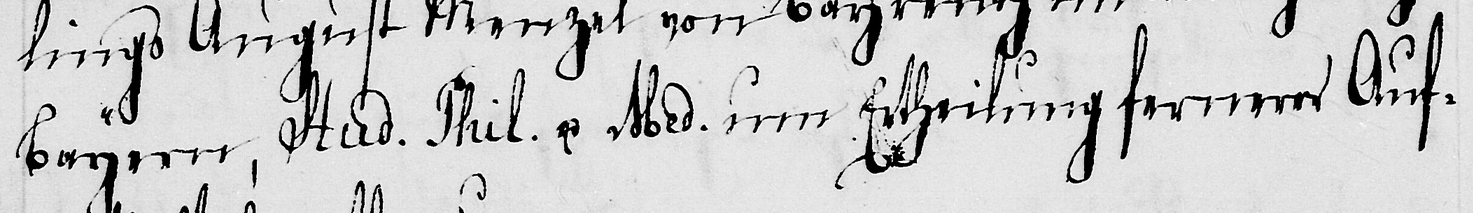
Bayern, Stud. Phil. & Med. um Ertheilung fernerer Auf¬
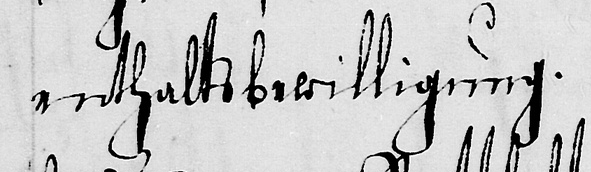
enthaltsbewilligung.
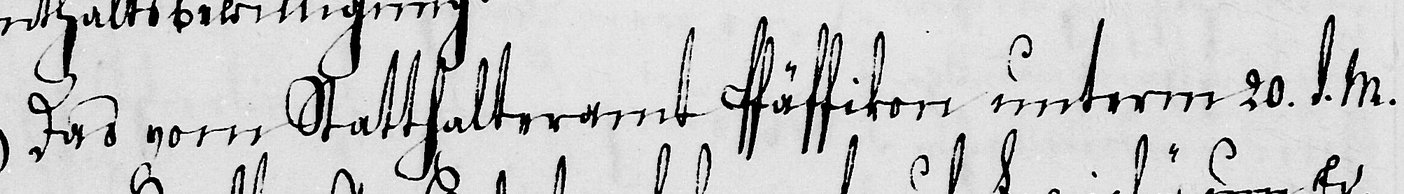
Das vom Statthalteramt Pfäffikon unterm 20. d.
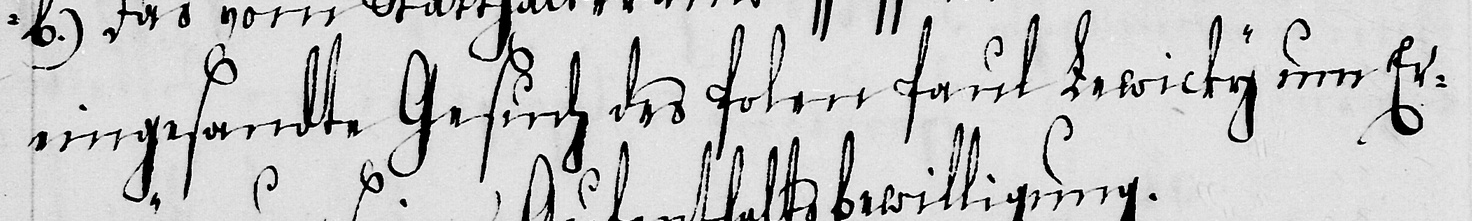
eingesandte Gesuch des Polen Paul Lewicky um Er¬
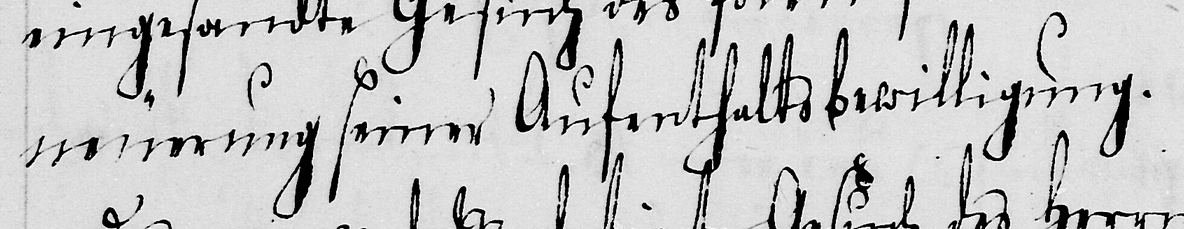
neuerung seiner Aufenthaltsbewilligung.
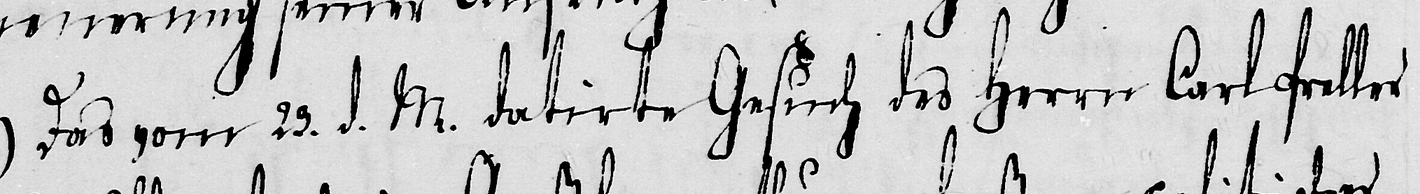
Das vom 23. d. M. datirte Gesuch des Herrn Carl Prell¬
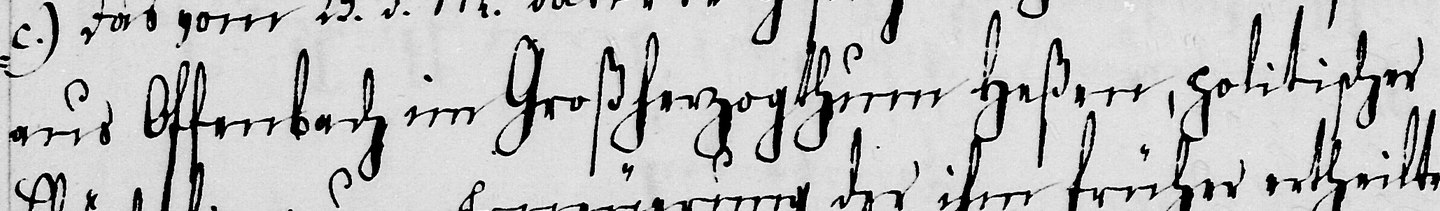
aus Offenbach im Großherzogthum Heßen, politischer
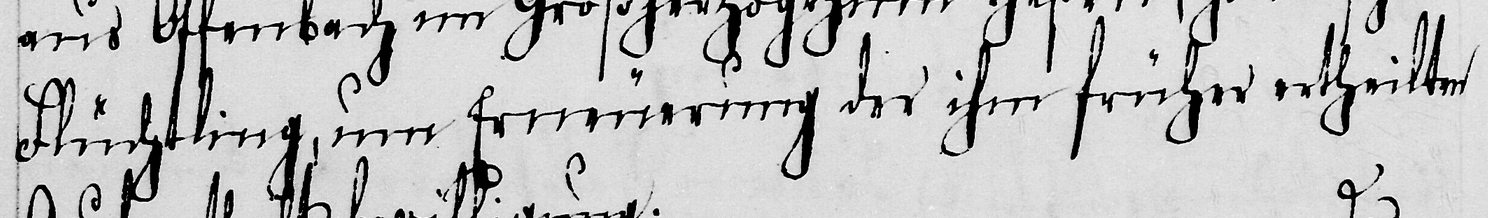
Flüchtling, um Erneuerung der ihm früher ertheilten
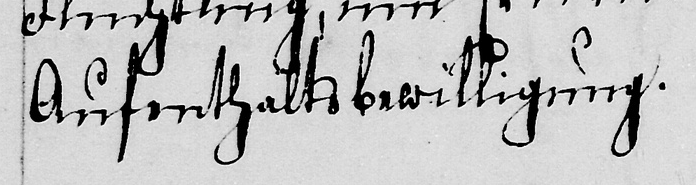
Aufenthaltsbewilligung.
